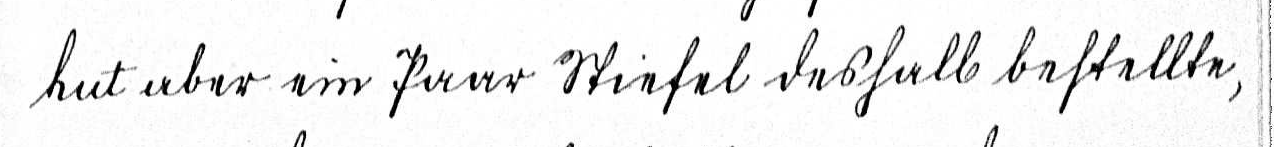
hut aber ein Paar Stiefel deshalb bestellte,
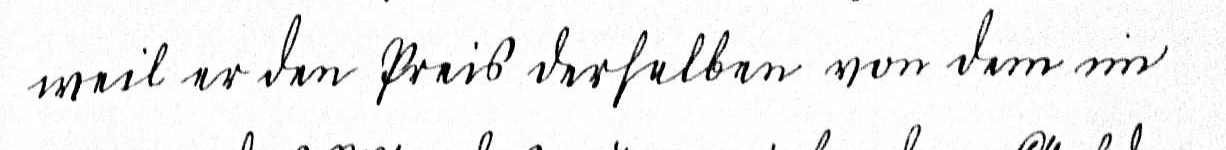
weil er den Preis derselben von dem im
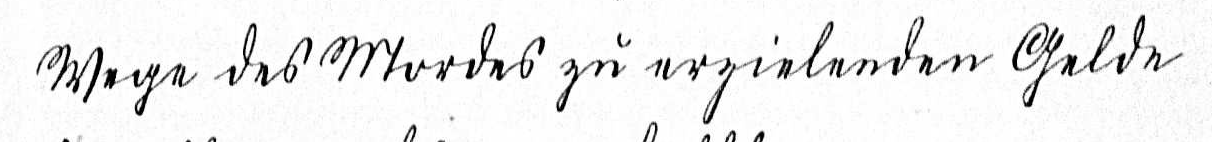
Wege des Mordes zu erzielenden Gelde
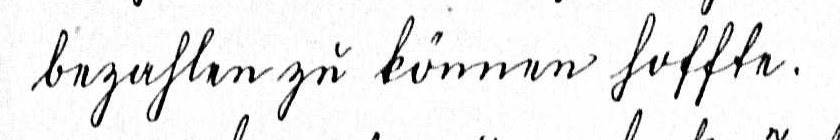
bezahlen zu können hoffte.
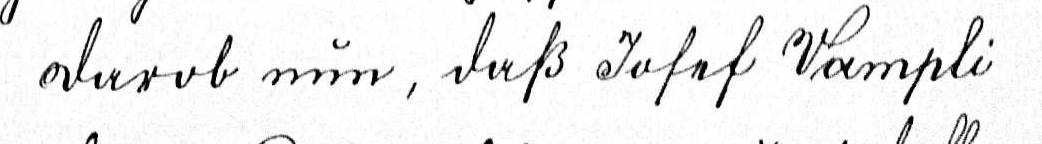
Darob nun, daß Josef Vampli
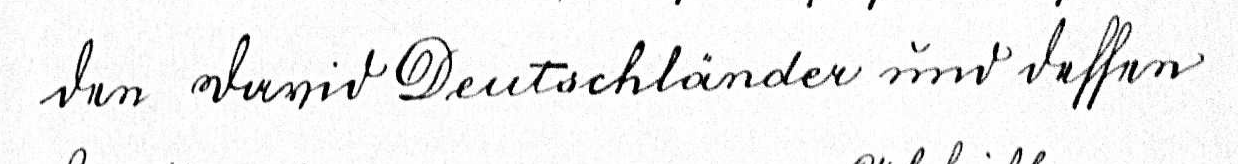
den David Deutschländer und dessen
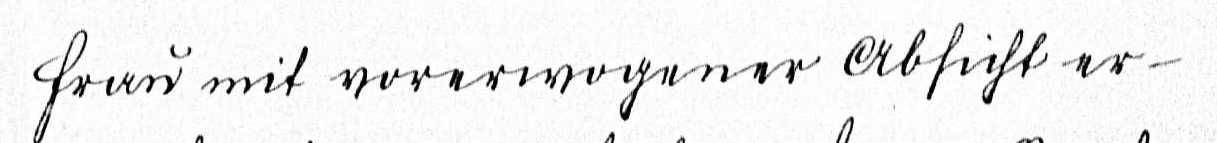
Frau mit vorerwogener Absicht er¬
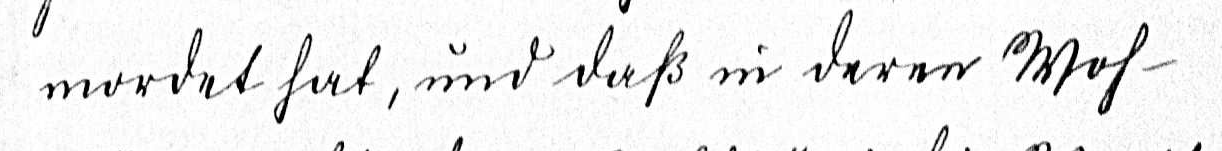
mordet hat, und daß in deren Who¬
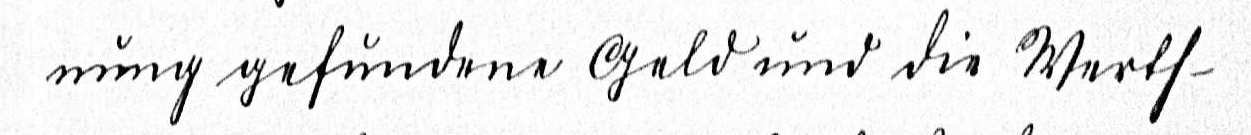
nung gefundene Geld und die Werth¬
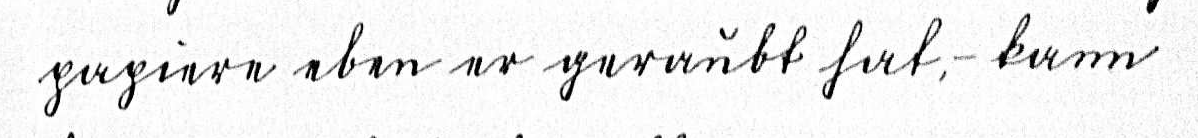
papiere eben er geraubt hat, – kann
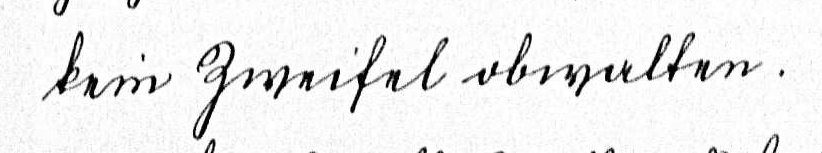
kein Zweifel obwalten.
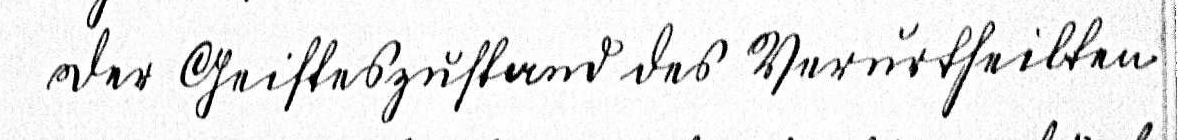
Der Geisteszustand des Verurtheilten
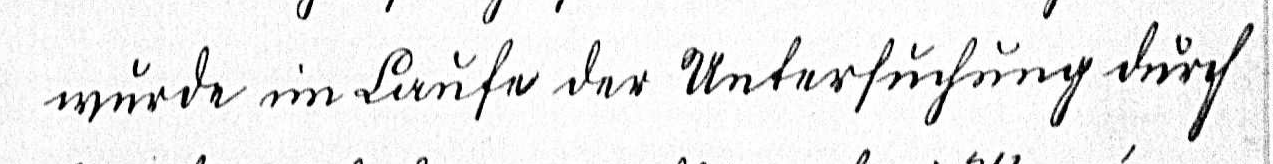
wurde im Laufe der Untersuchung durch
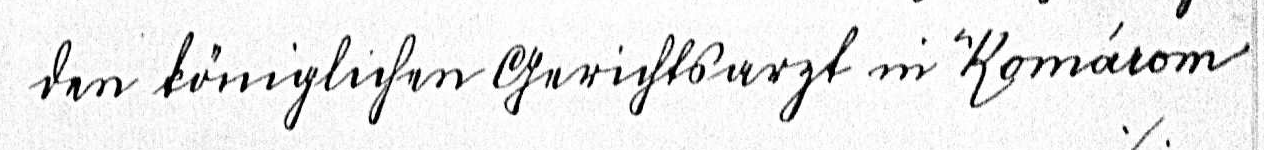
den königlichen Gerichtshof in Komárom
